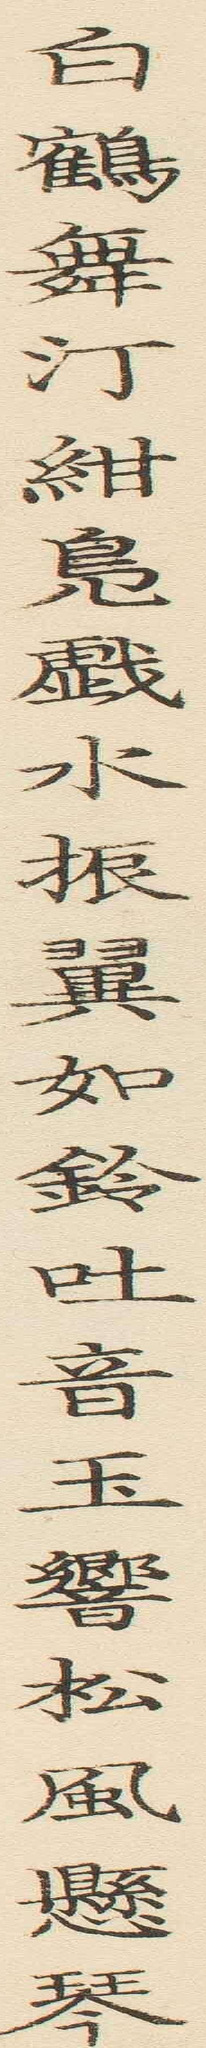白鶴舞汀紺𠒎戯水振翼如鈴吐音玉響松風懸琴
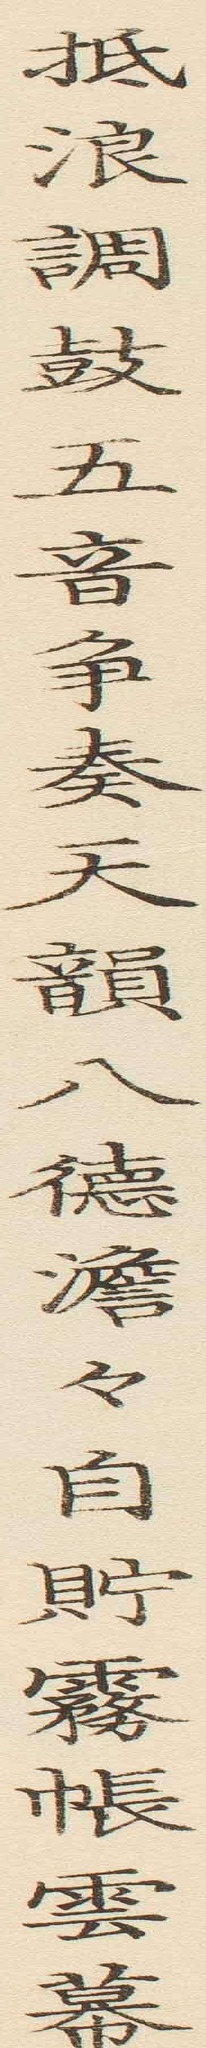抵浪調鼓五音争奏天韻八德澹々自貯霧帳雲幕
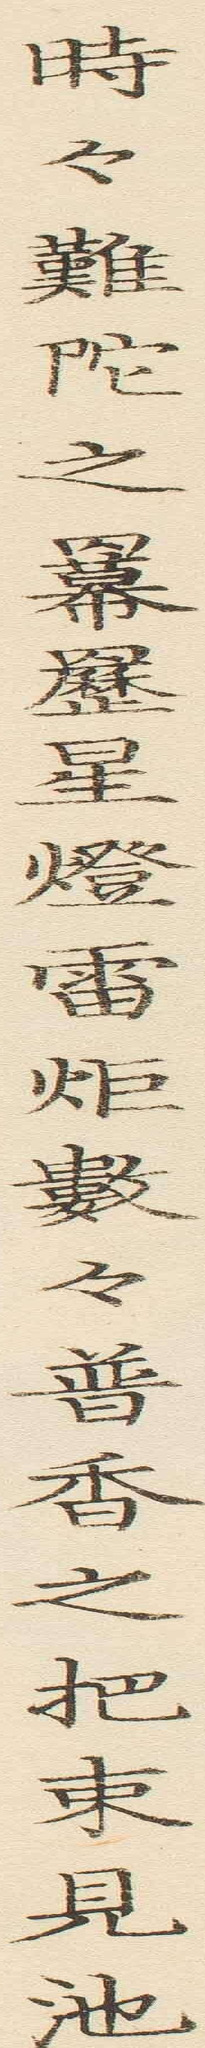時々難陀之羃䍥星燈雷炬數々普香之把束見池
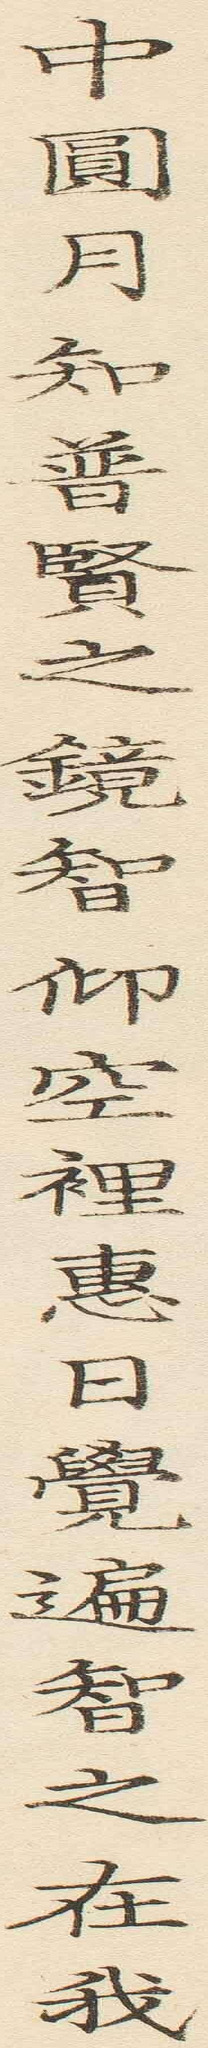中圓月知普賢之鏡智仰空裡惠日覺遍智之在我
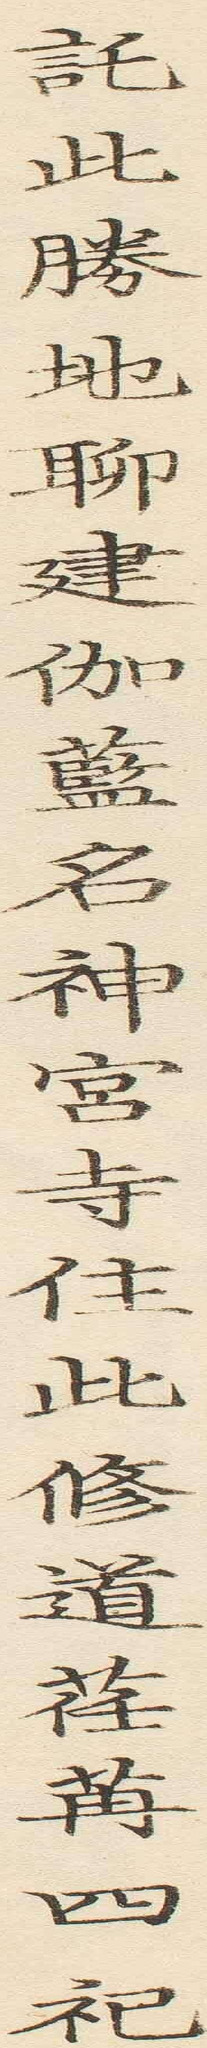託此勝地聊建伽藍名神宮寺住此修道荏苒四祀
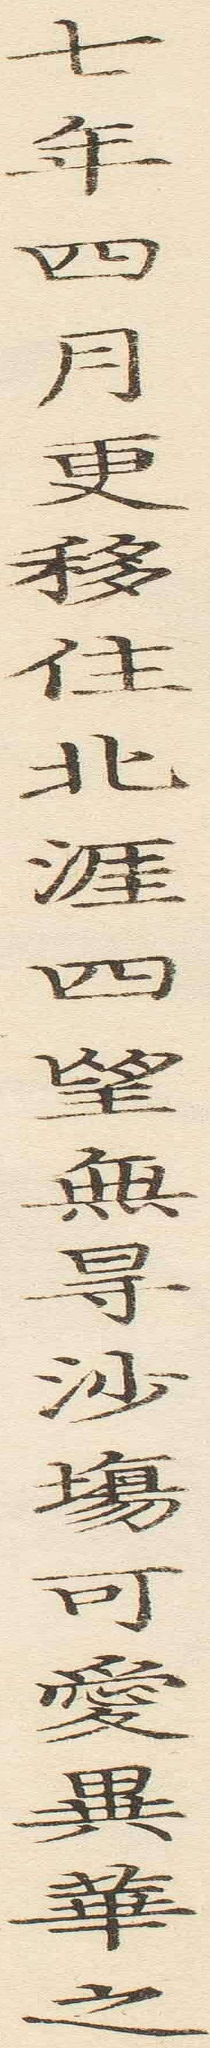七年四月更移住北涯四望無㝵沙塲可愛異華之
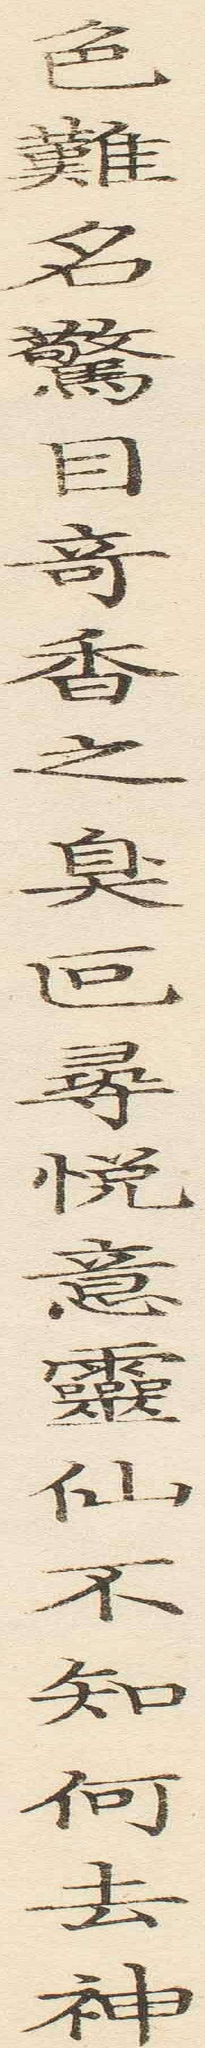色難名驚目竒香之臭叵尋悦意靈仙不知何去神
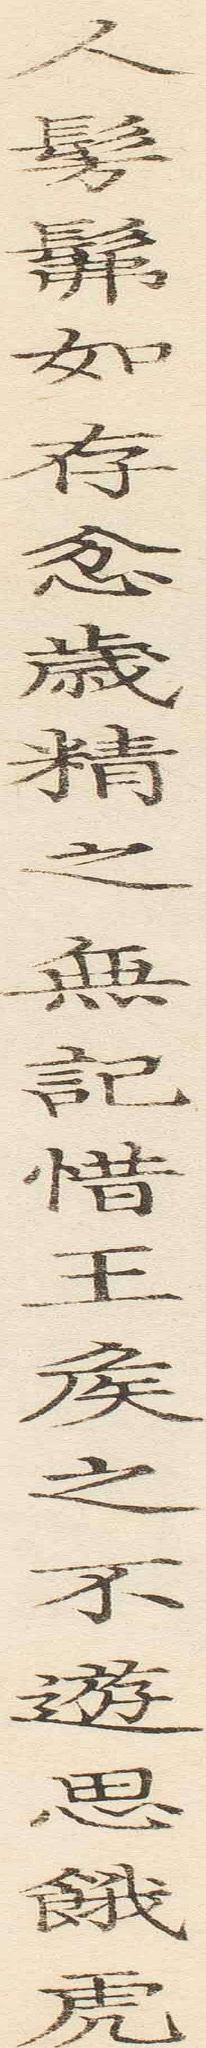人髣髴如存忿歳精之無記惜王矦之不遊思餓虎
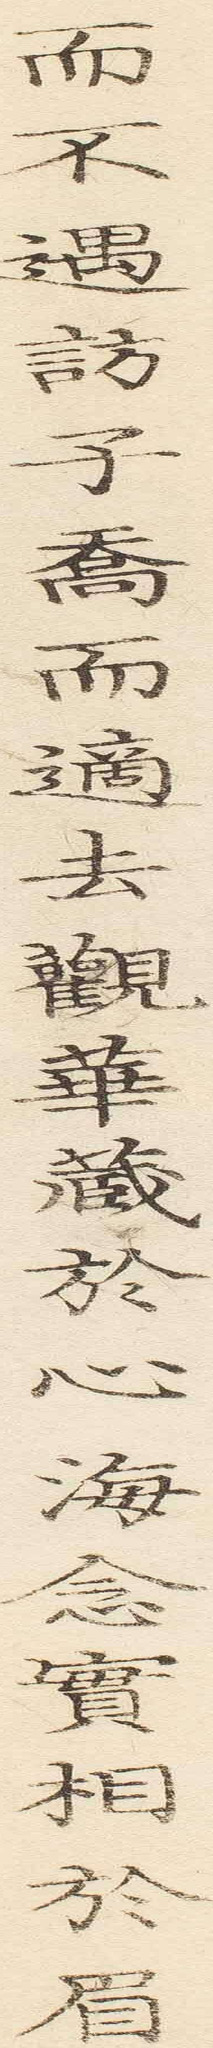而不遇訪子喬而適去觀華蔵於心海念實相於眉
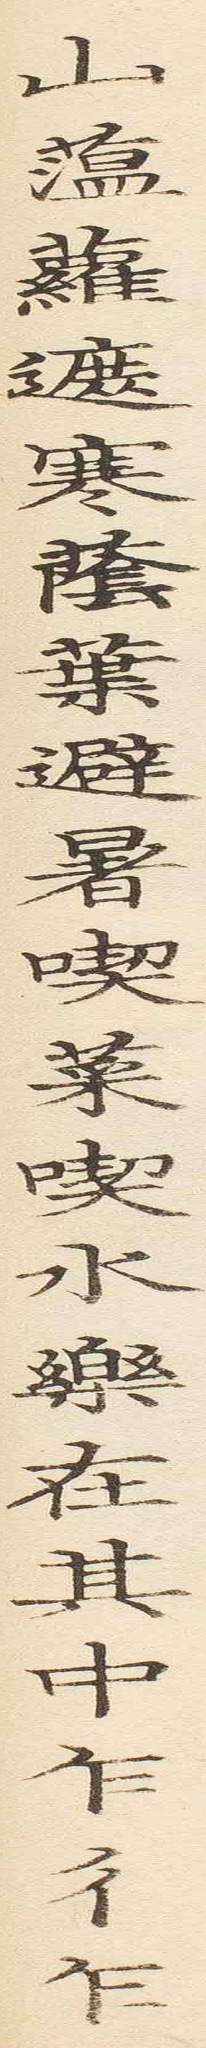山薀蘿遮寒蔭葉避暑喫菜喫水樂在其中乍彳乍
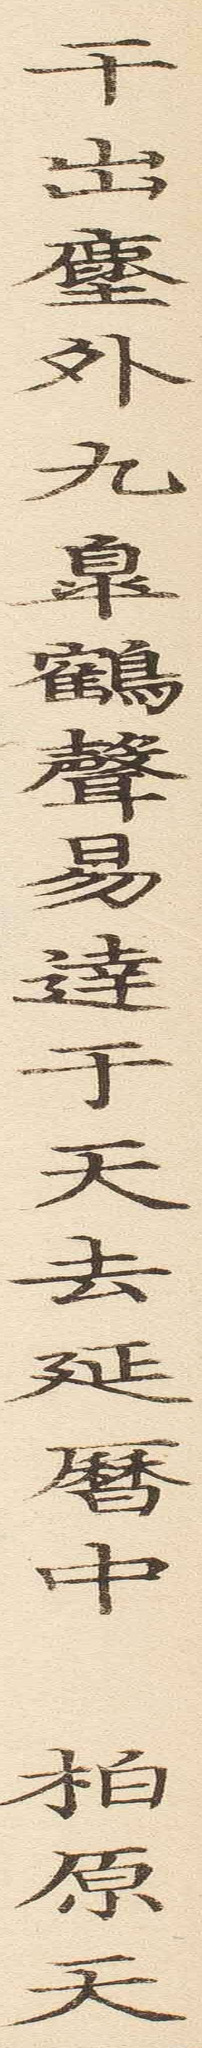干出塵外九臯鶴聲易達于天去延曆中柏原天
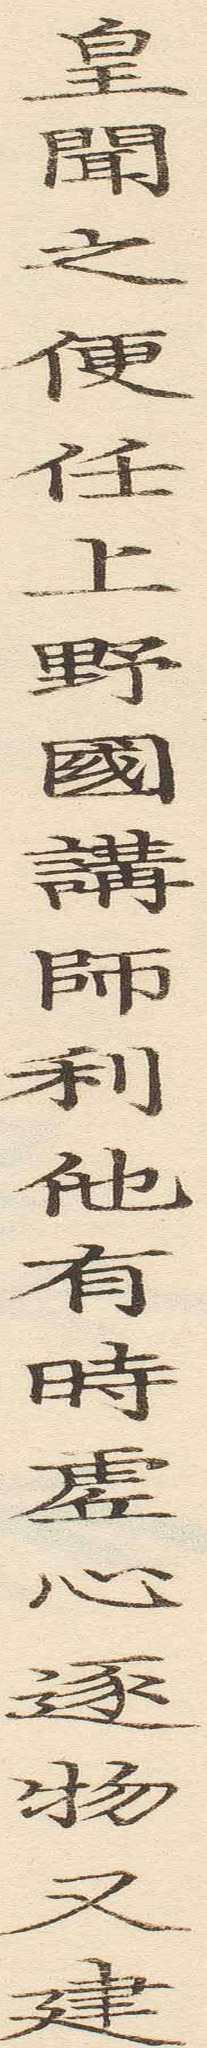皇聞之便任上野國講師利他有時虗心逐物又建
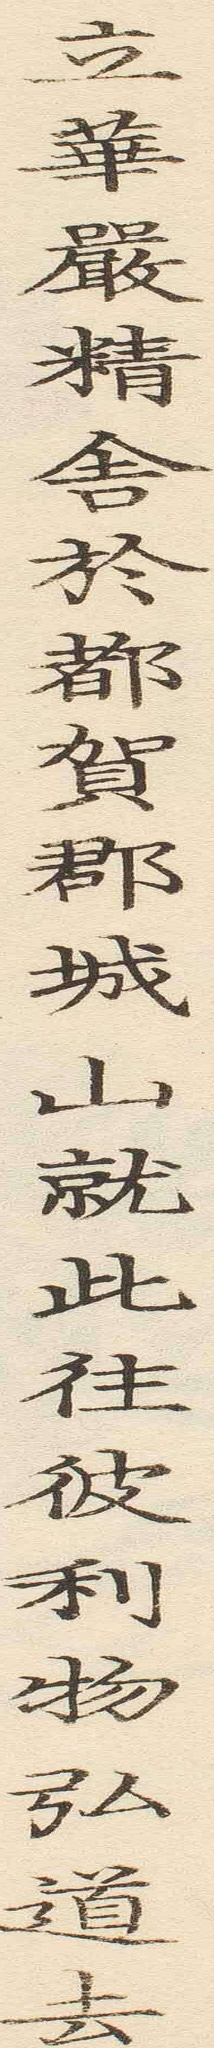立華嚴精舎於都賀郡城山就此往彼利物弘道去
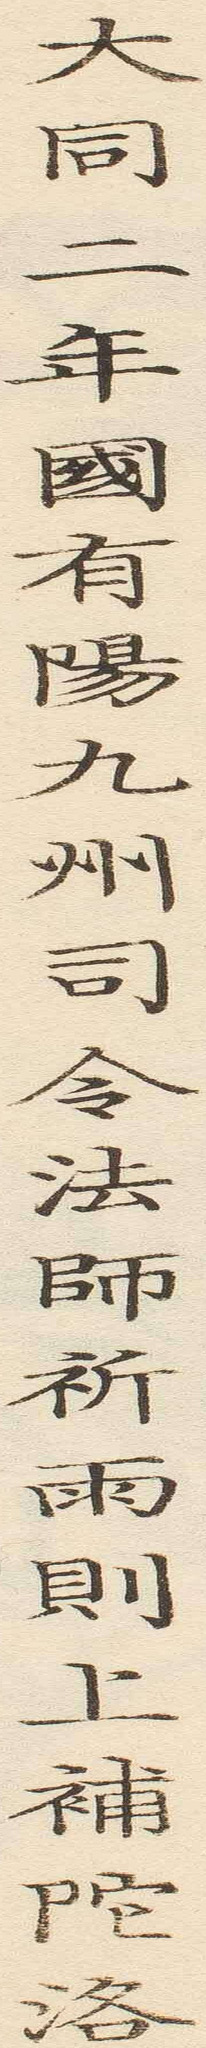大同二年國有陽九州司令法師祈雨則上補陀洛
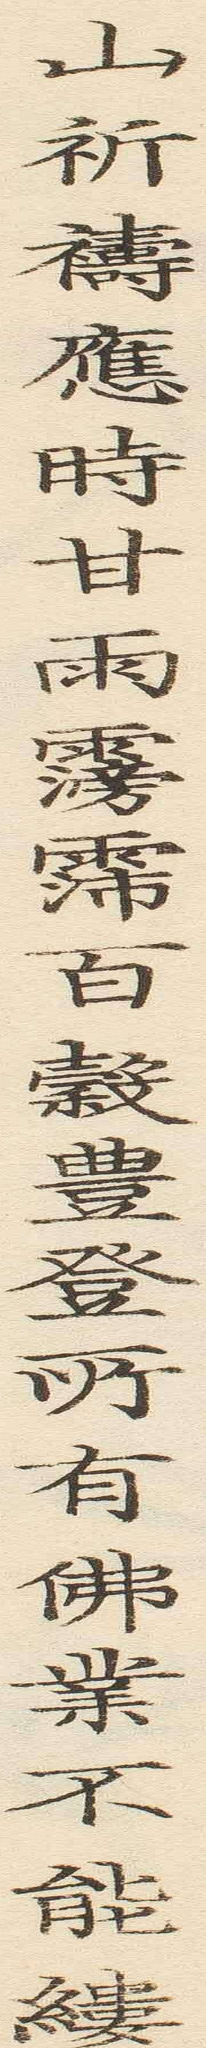山祈禱應時甘雨霶霈百穀豊登所有佛業不能縷
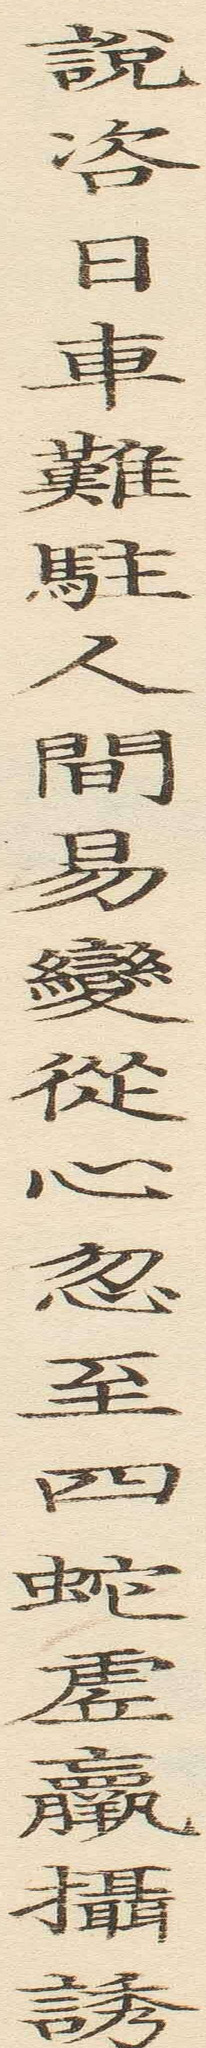說咨日車難駐人間易變從心忽至四蛇虗羸攝誘
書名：日光山志
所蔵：東京学芸大学附属図書館 国文学研究資料館
